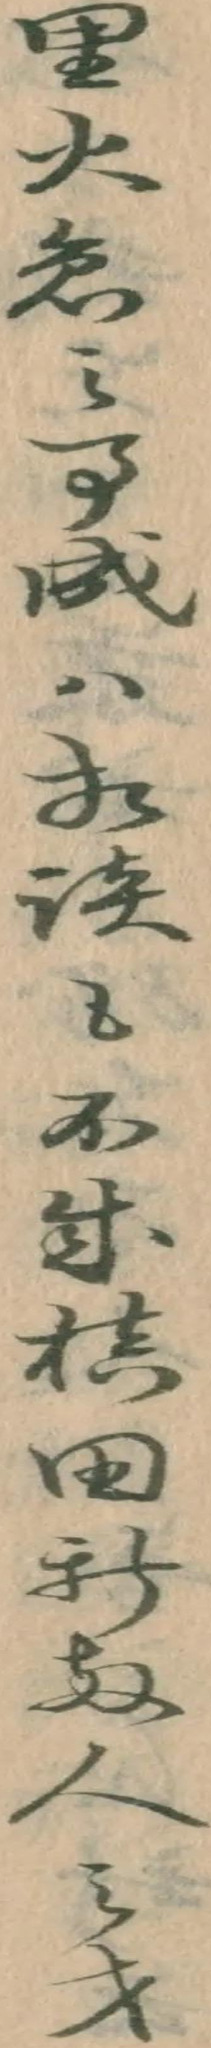里火急之事成は相談も不成槙田新両人之才
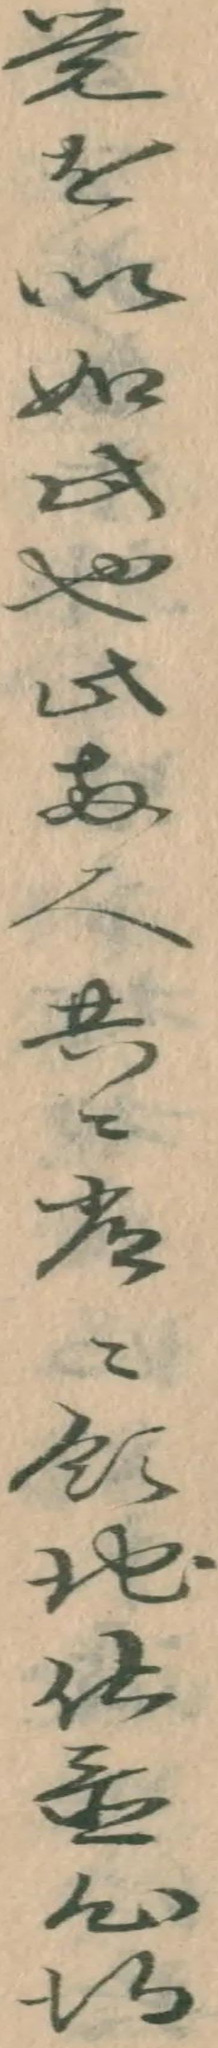覚を以如此也此両人共に常に領地仕置心得
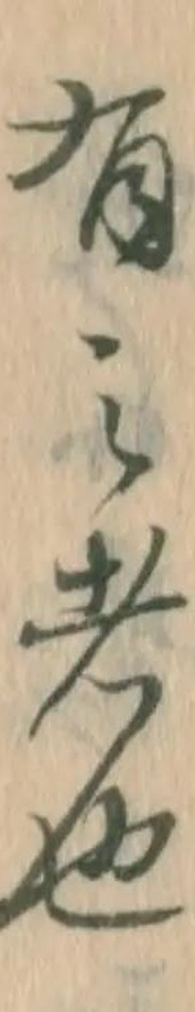有之者也
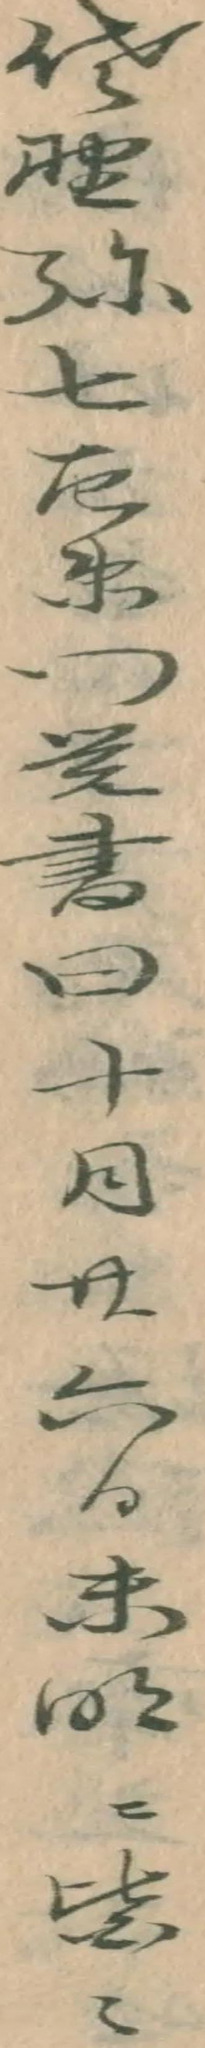佐野弥七左衛門覚書日十月廿六日未明に皆々
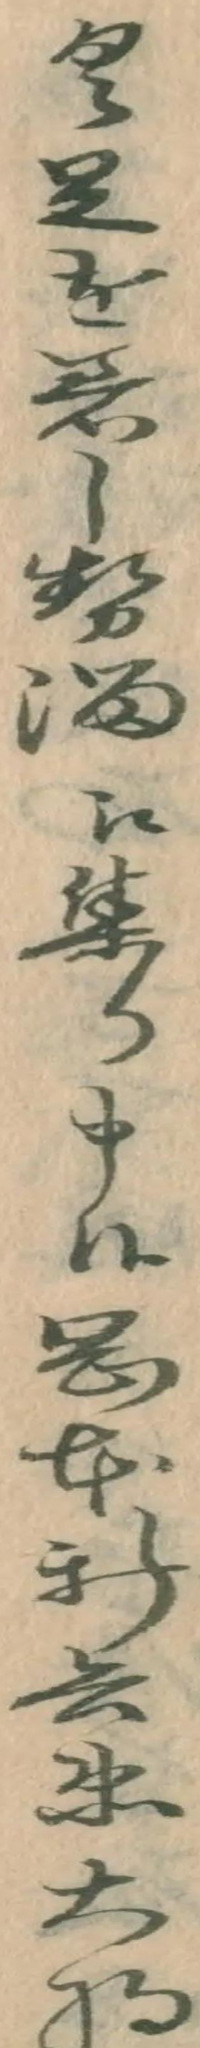具足を着し勢溜え集り申候岡本新兵衛大将

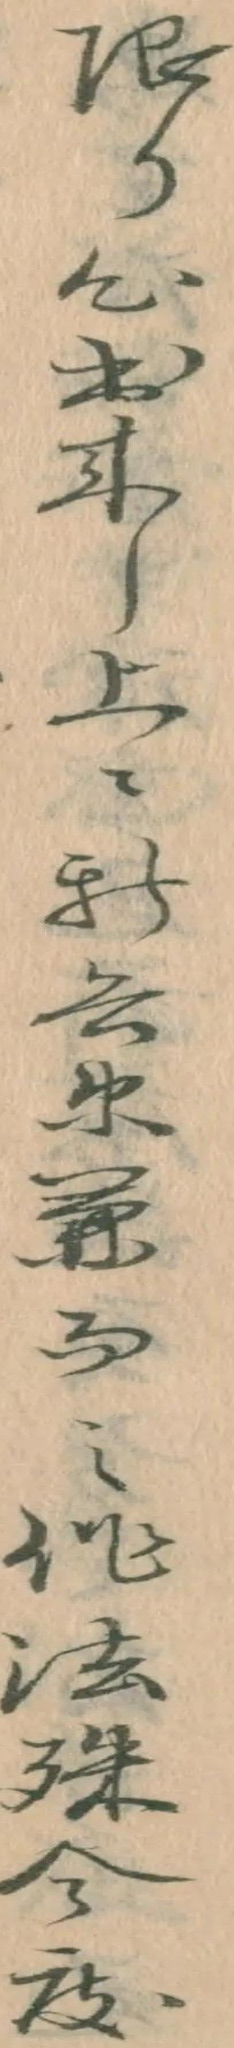限り心出来し上に新兵衛兼而之作法殊今度
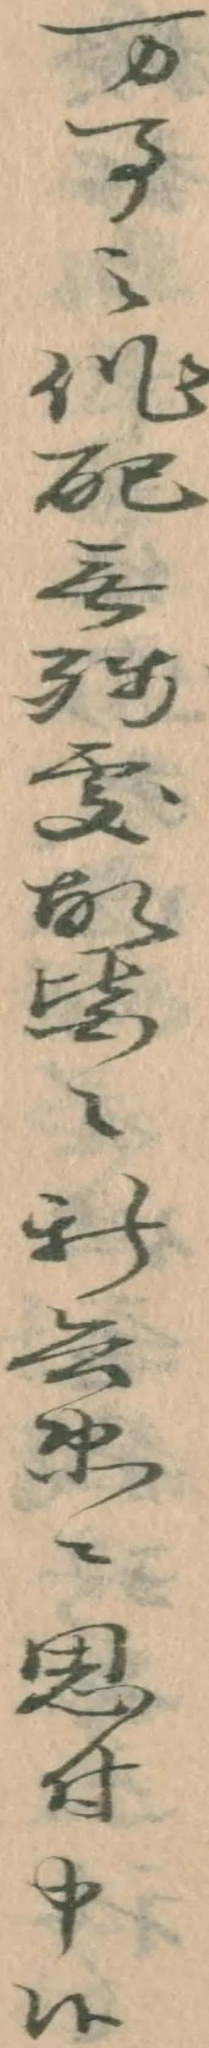万事之作配無残処故皆々新兵衛に思付申候
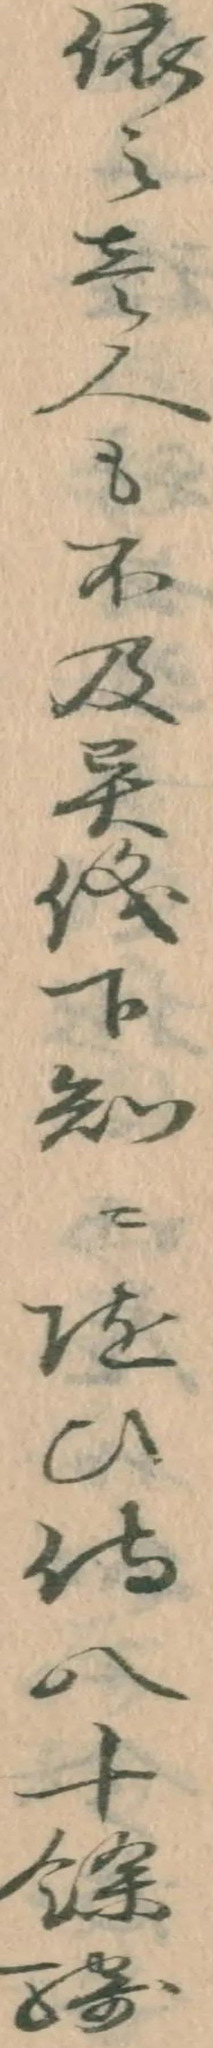依之壱人も不及異儀下知に随ひ侍八十余騎
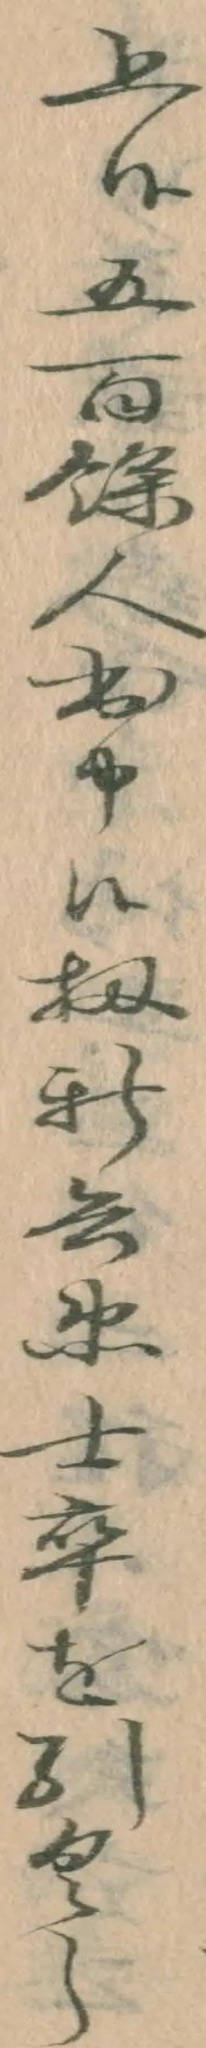上候五百余人出申候扨新兵衛士卒を引具し
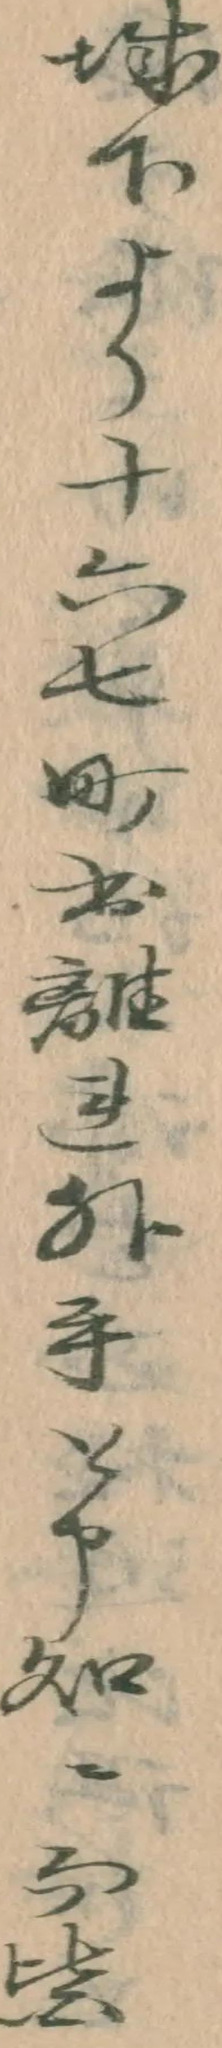城下より十六七町出離れ外平と申処に而皆
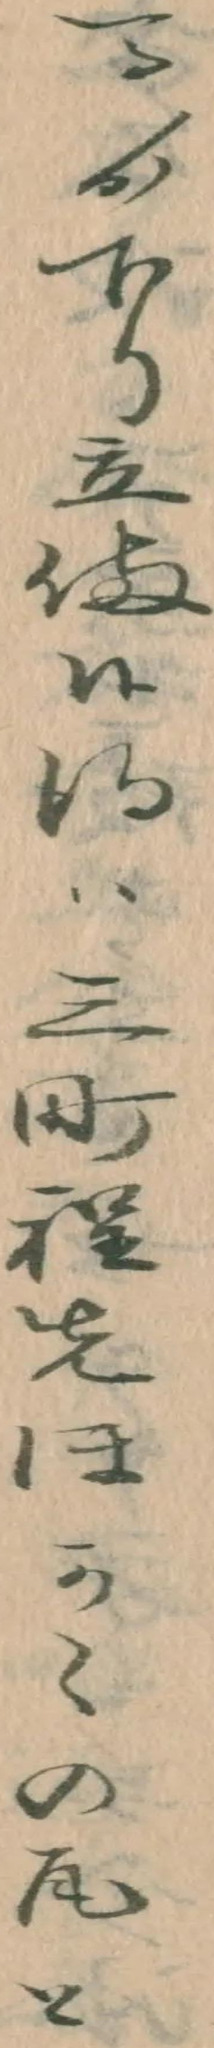馬ゟ下り立備候得は三町程先ほかく？の尾と
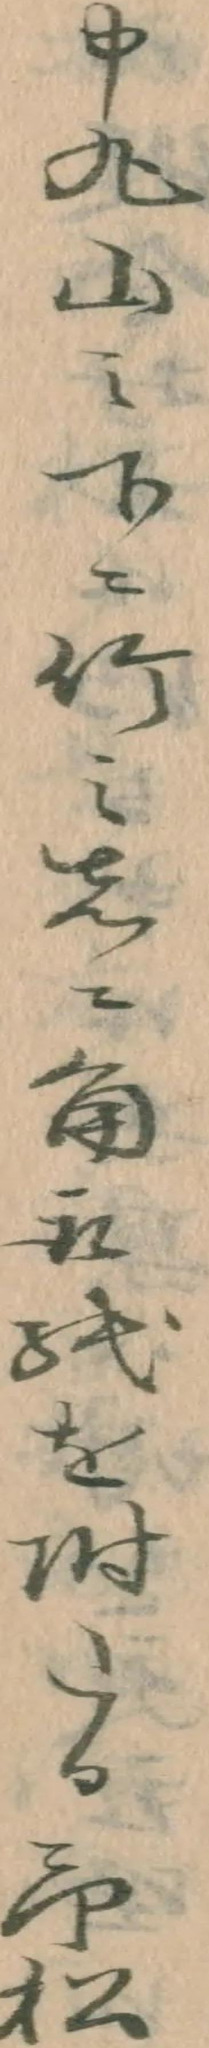申丸山之下に竹之先に角取残を附たる予？松
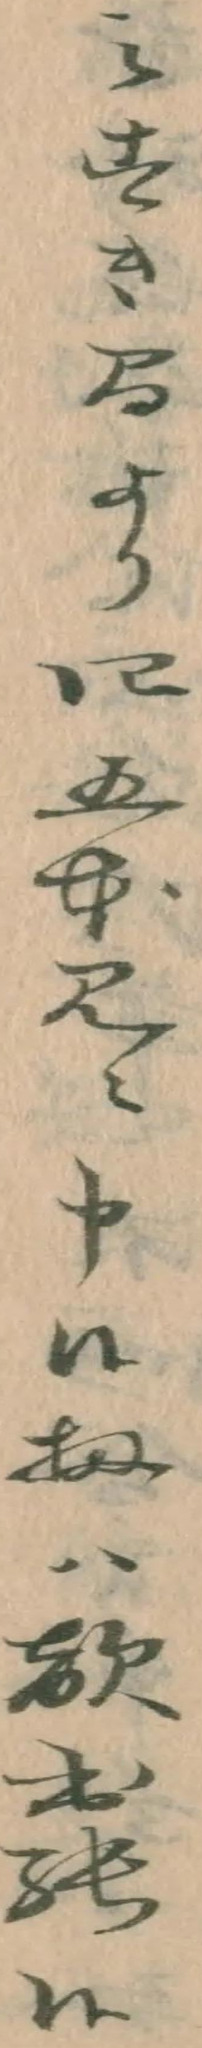之すき間より四五本見に申候扨は敵出張候
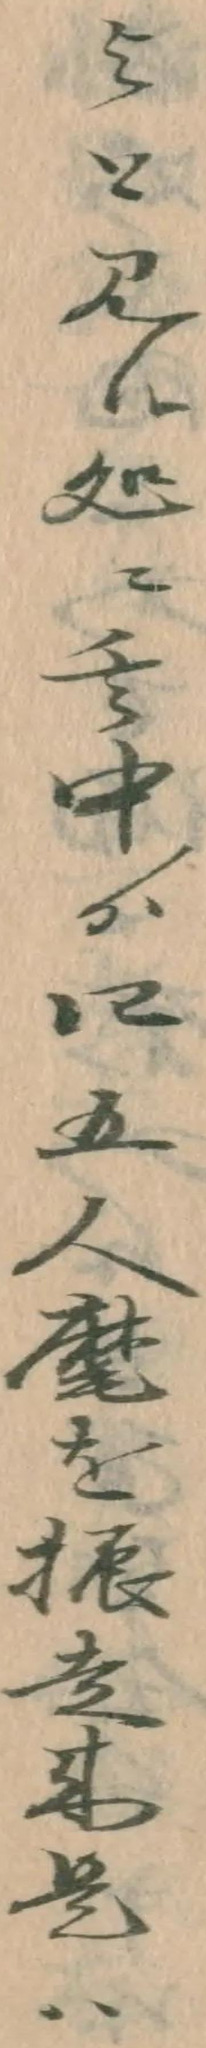よと見候処に其中ゟ四五人麾を振走来是は
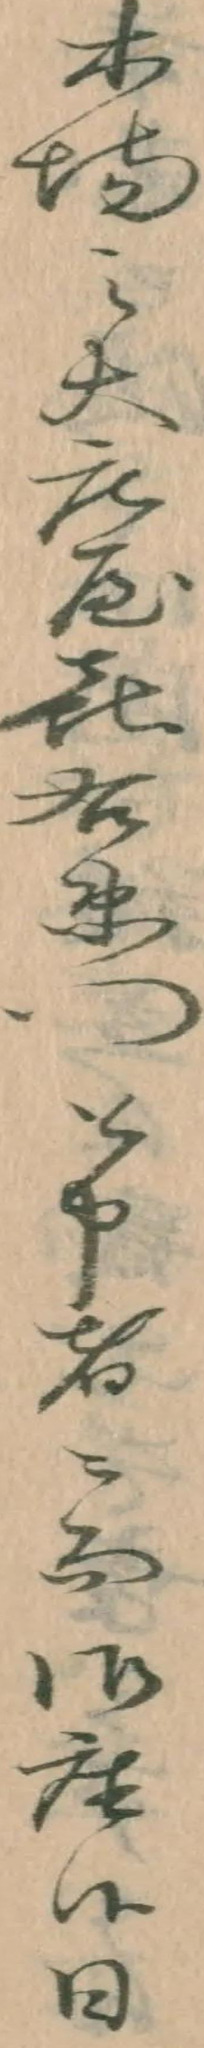木場之大庄屋喜右衛門と申者に而御座候日
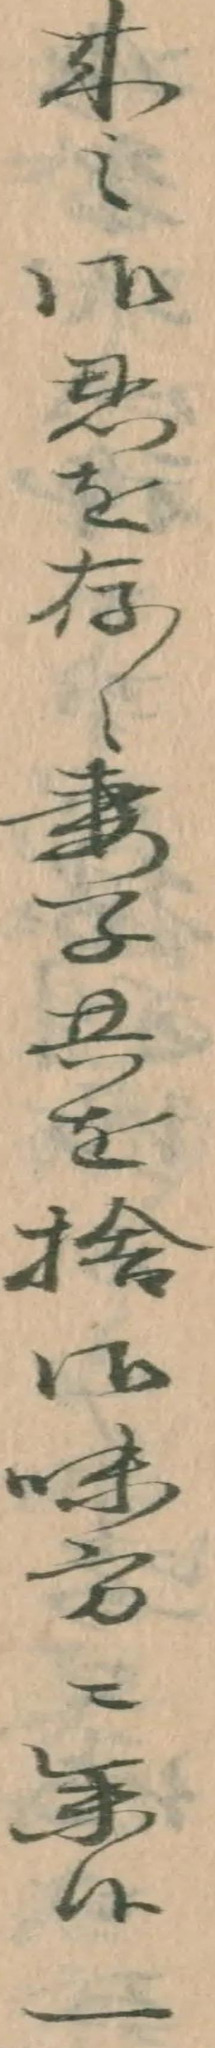来之御忍を存し妻子共を捨御味方に参候一
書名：切支丹御退治記 49巻. [1]
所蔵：国立国会図書館 National Diet Library, JAPAN
